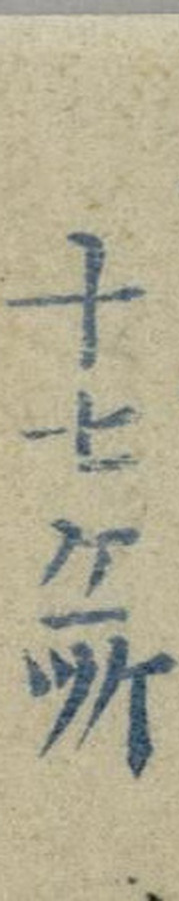十七ヶ所
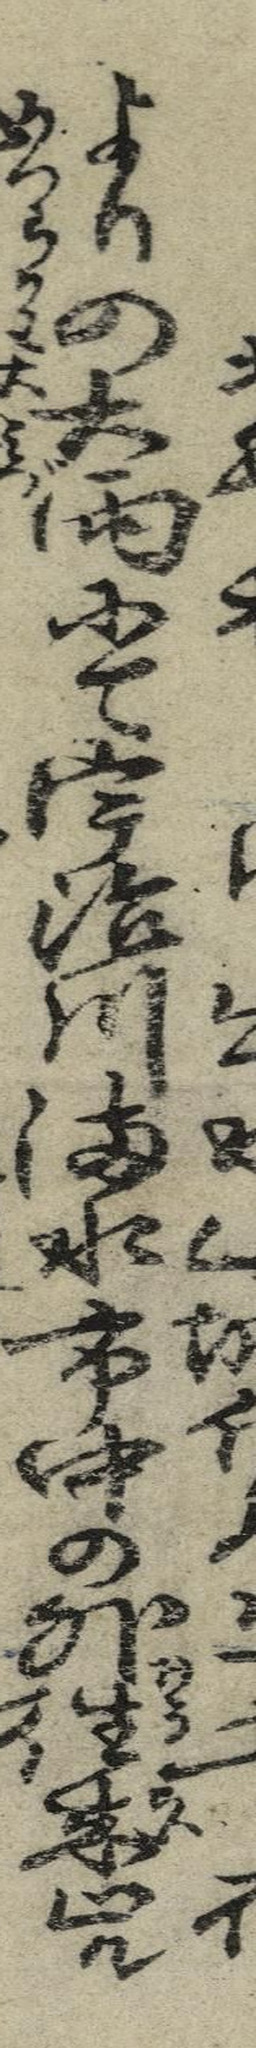よりの大雨にて宇治川満水市中の外往来止ル
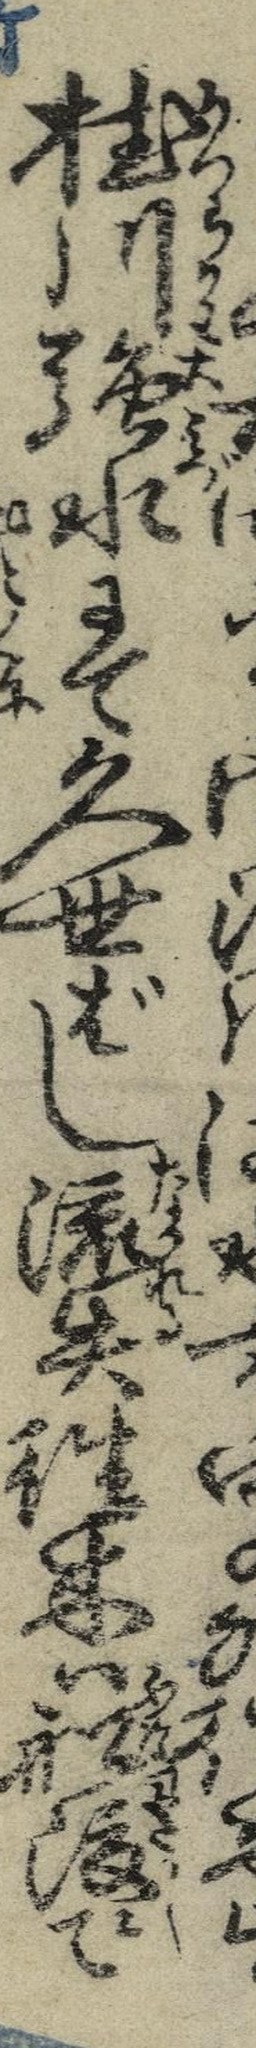桂川強水にて久世ばし流失往来は船渡で
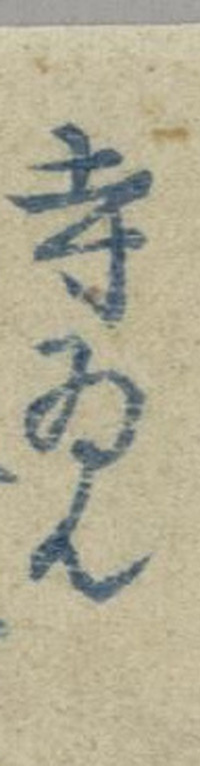寺ゐん
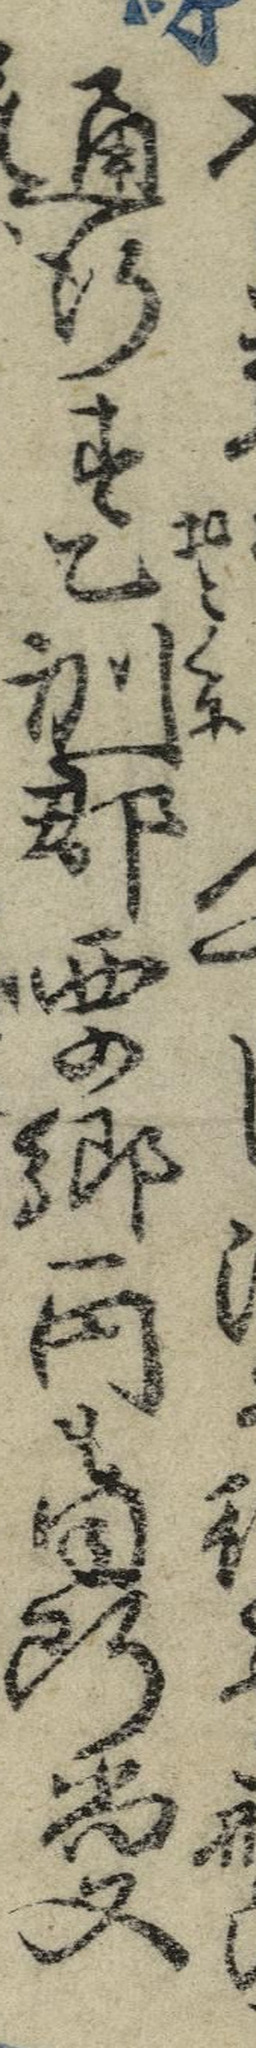通行す乙訓郡西の郷一円も同断尚又
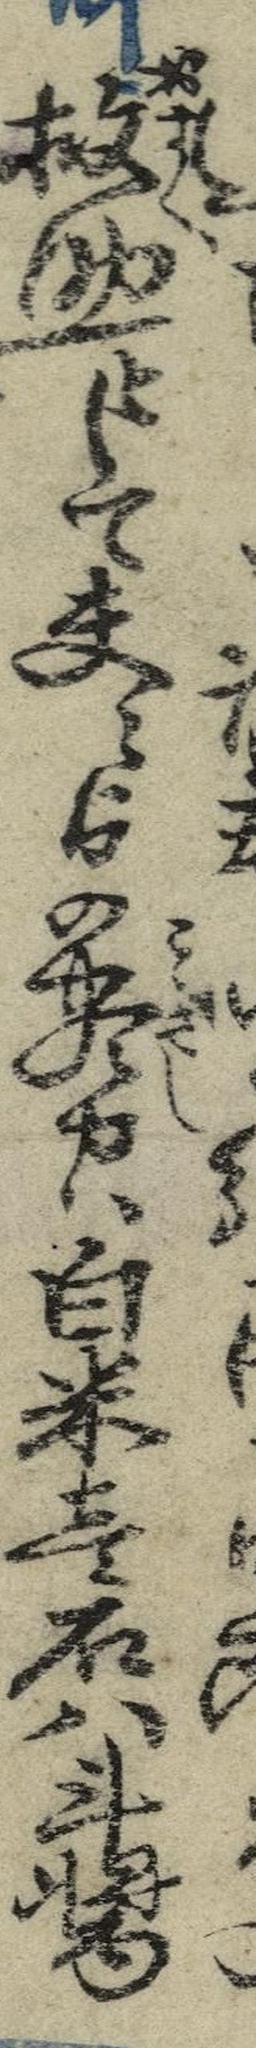救助として夫〻ゟの尽力は白米壱石八斗醤
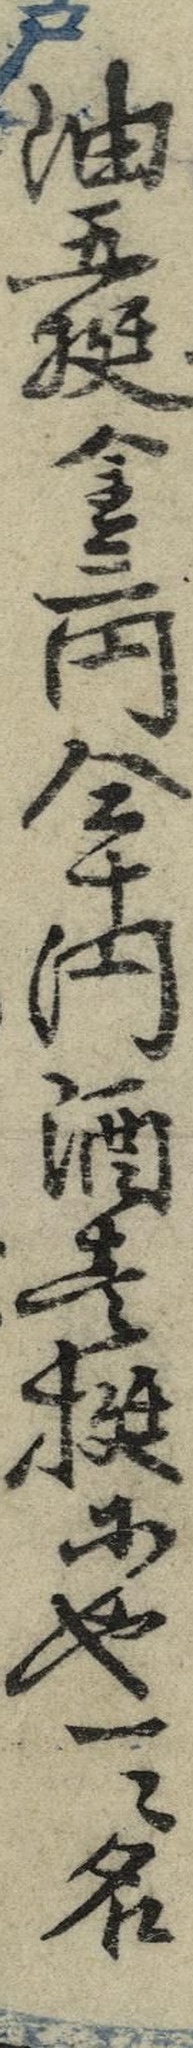油五挺金二円仝十円酒壱挺にや一〻名
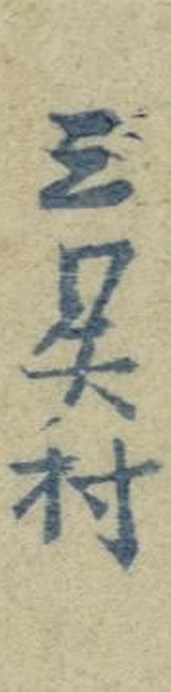三異村
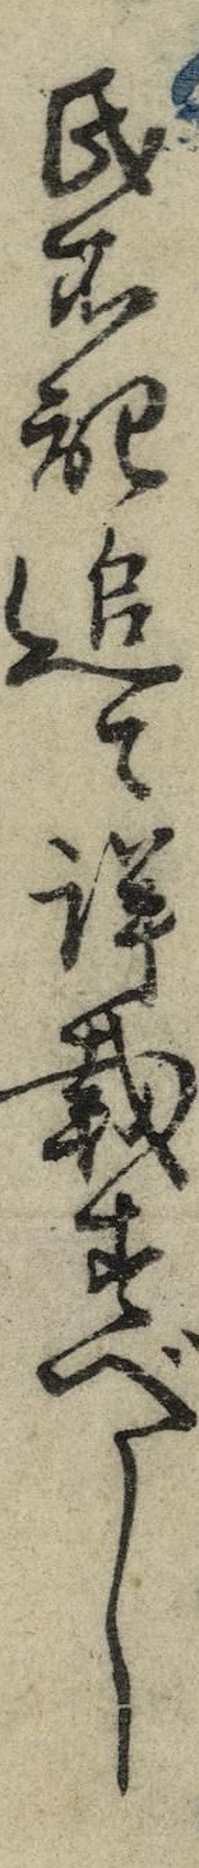氏不記追て詳載すべし
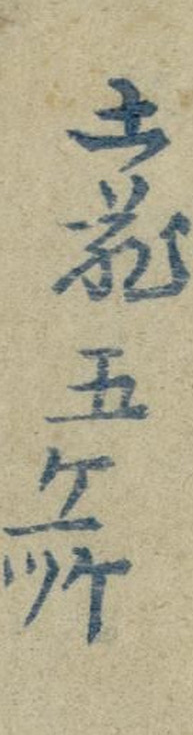土蔵五ヶ所
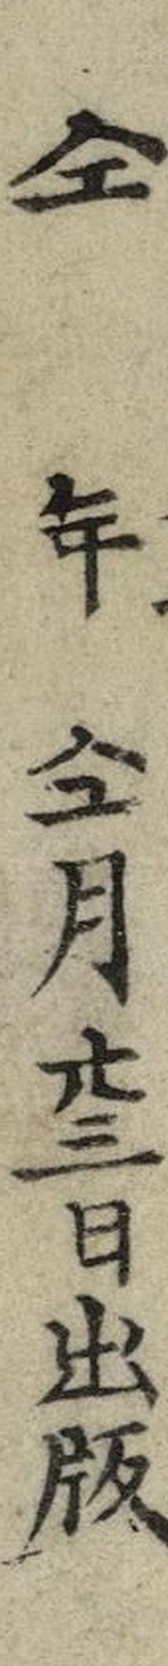仝年仝月廿三日出版
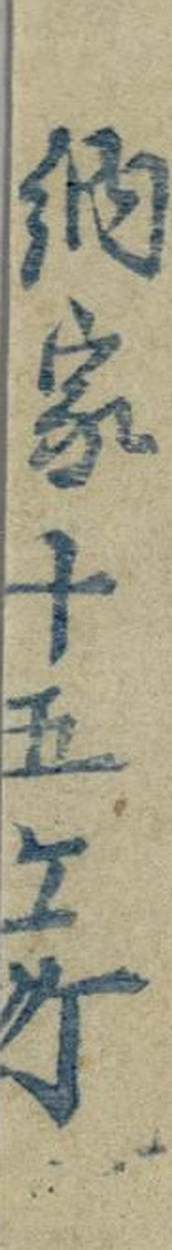納屋十五ヶ所
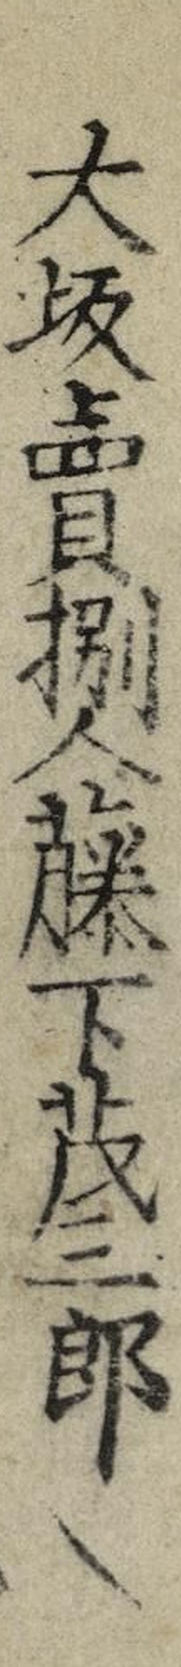大坂売捌人藤下茂三郎
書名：河内摂津大水のうわさ
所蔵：東京大学地震研究所図書室 Earthquake Research Institute Library, The University of Tokyo, JAPAN
